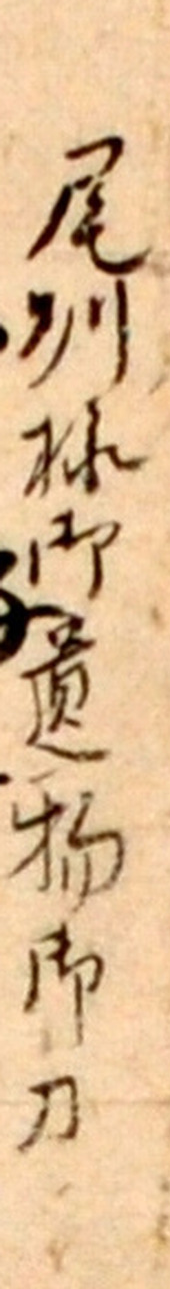尾州様御遺物御刀
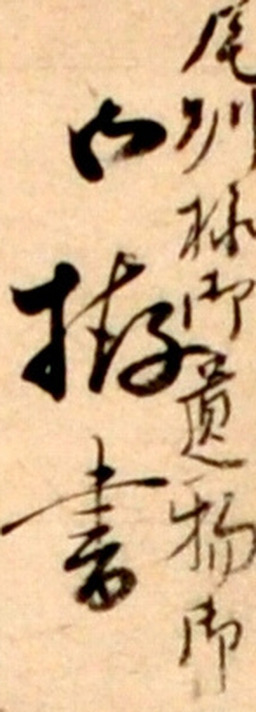御拵書

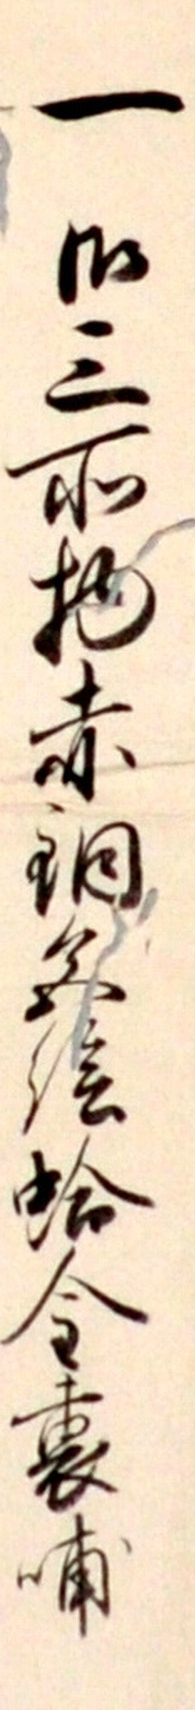一御三所物赤銅色絵蛤金裏哺
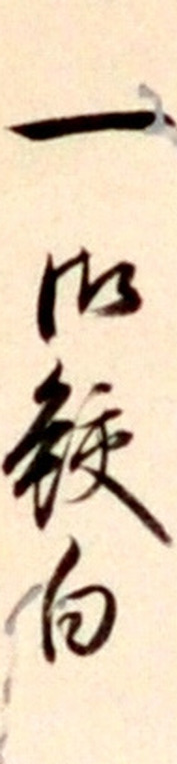一御鮫白
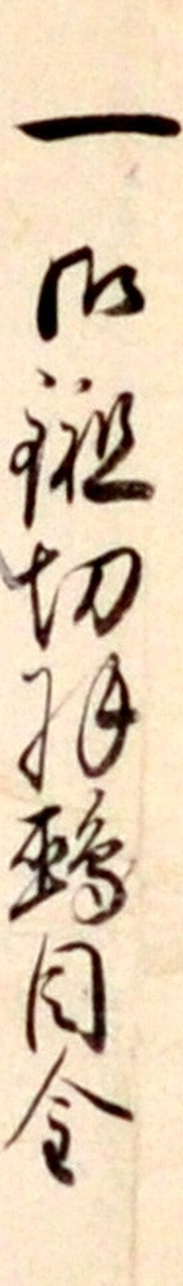一御鎺切羽鵐目金
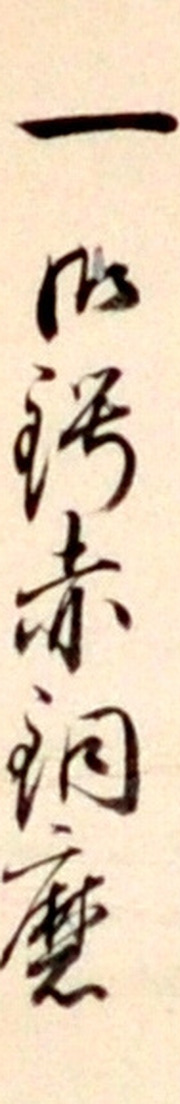一御鍔赤銅磨
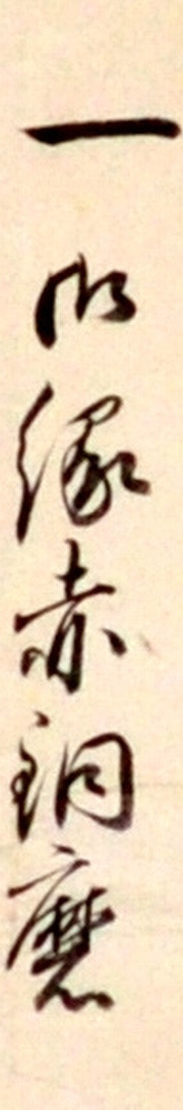一御縁赤銅磨
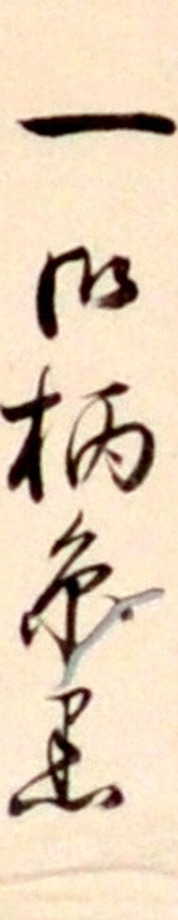一御柄糸黒
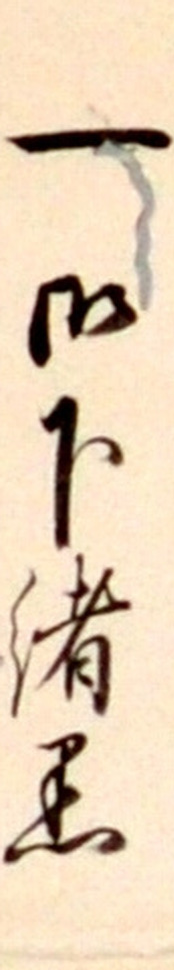一御下緒黒
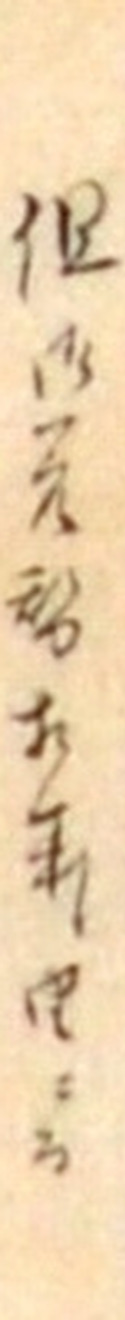但御差替相成候由ニ而
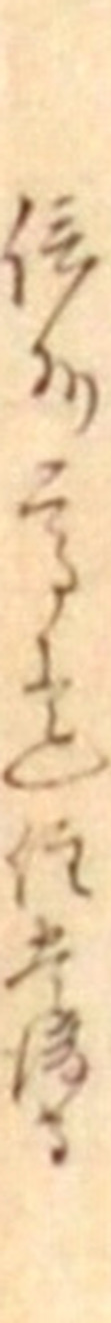信州高遠住豊後守
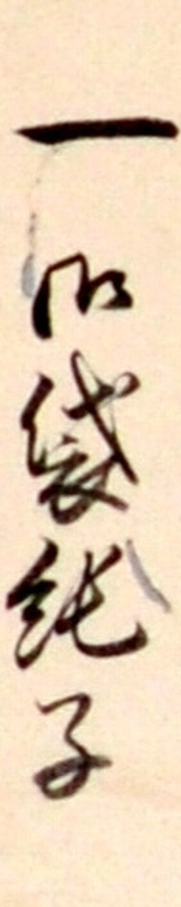一御袋純子
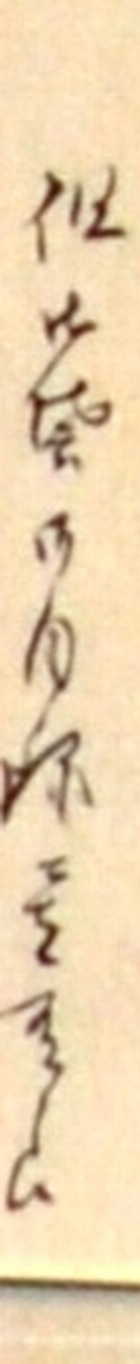但御袋御目録ニ者有之候
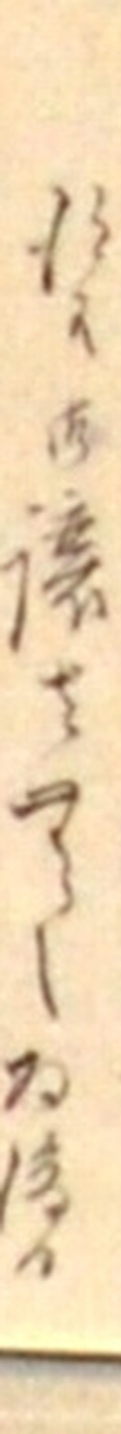得共御譲者無之為後日
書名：御拵書
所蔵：伊那市立高遠町図書館・合同会社AMANE
